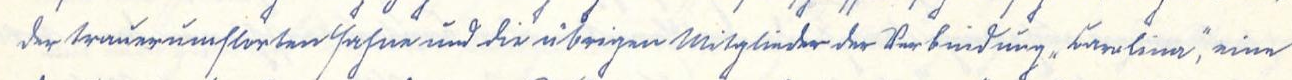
der trauerumflorten Fahne und die übrigen Mitglieder der Verbindung „Carolina“, eine
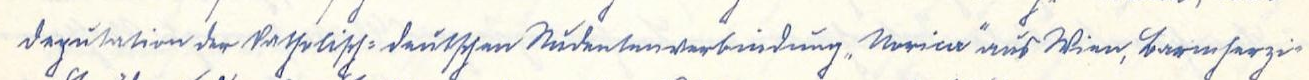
Deputation der katholisch-deutschen Studentenverbindung Norica aus Wien, Barmherzi-
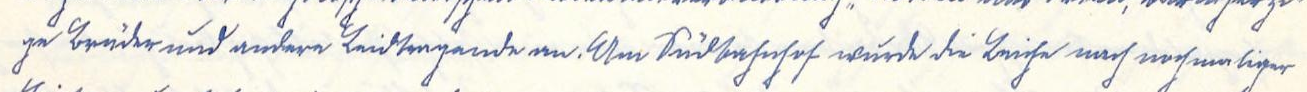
gen Brüder und andere Leidtragende an. Am Südbahnhof wurde die Leiche nach nochmaliger
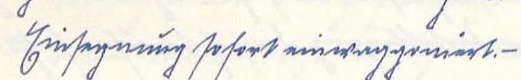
Einsegnung sofort einwaggoniert.-
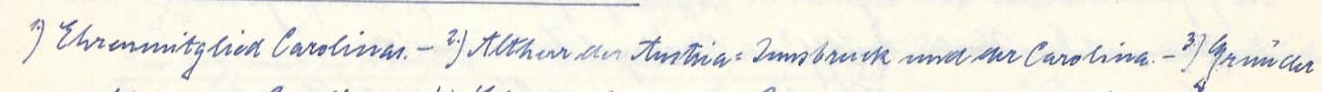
1) Ehrenmitglied Carolina.- 2) Altherr der Austria-Innsbruck und der Carolina.- 3) Gründer
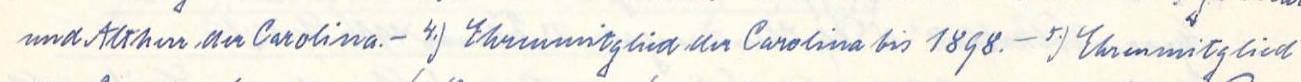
und Altherr der Carolina. 4) Ehrenmitglied der Carolina bis 1898.- 5) Ehrenmitglied
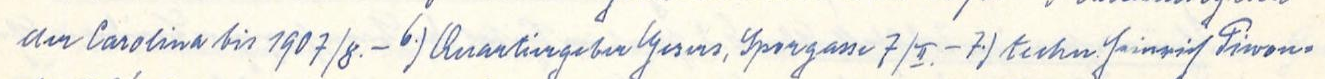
der Carolina bis 1907/8.- 6) Quartiergeber Gesers, Sporgasse 7.- 7) techn. Heinrich Piwon-
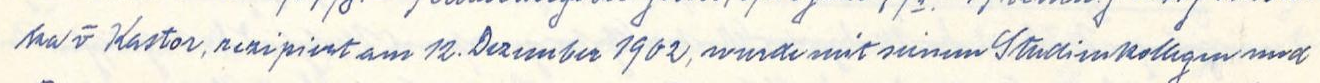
ka v/o Kastor, rezipiert am 12. Dezember 1902, wurde mit seinem Studienkollegen und
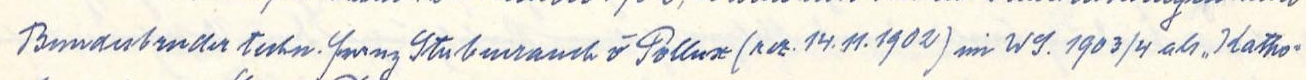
Bundesbrunder techn Franz Stubnrauch v/o Pollux (rez 14. 11. 1902) im WS 1903/4 als „Katho-
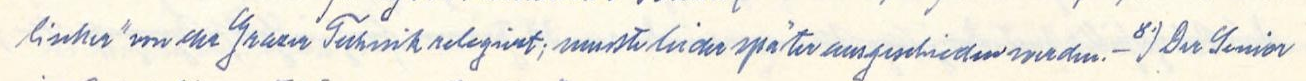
lischer“ von der Grazer Technik relegiert, musste leider später ausgeschieden werden. 8) Der Senior
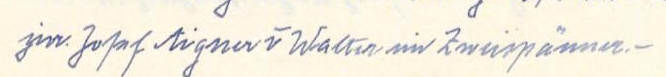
jur. Josef Aigner v/o Walter im Zweispänner.
